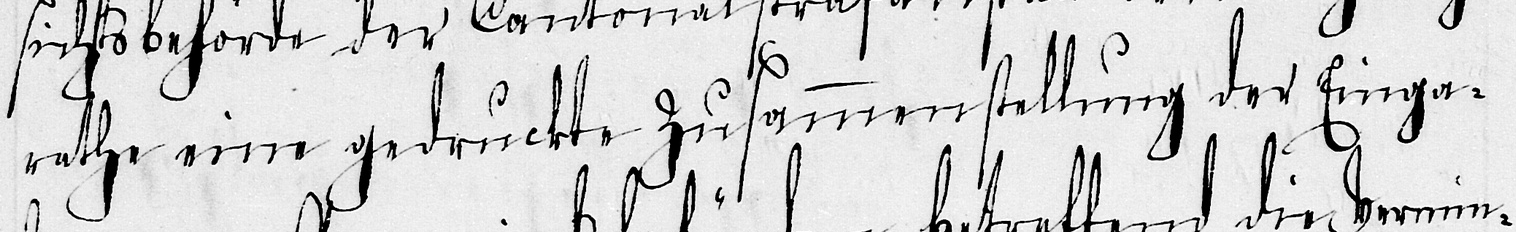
rathe eine gedruckte Zusammenstellung der Einga¬
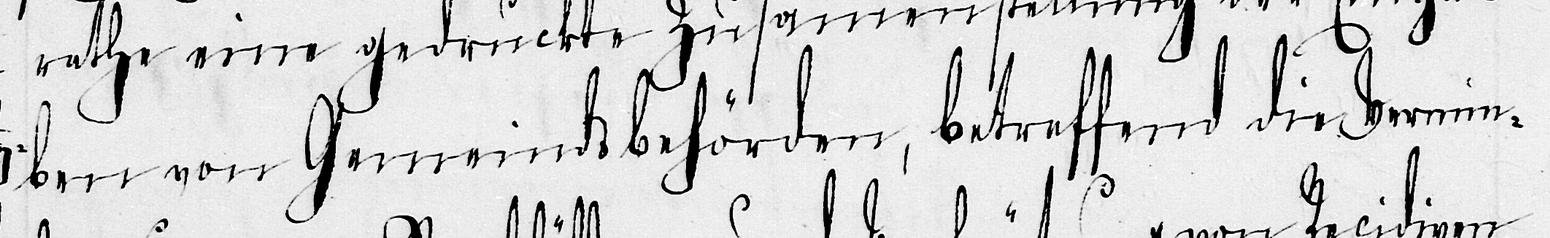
ben von Gemeindsbehörden, betreffend die Vermi¬
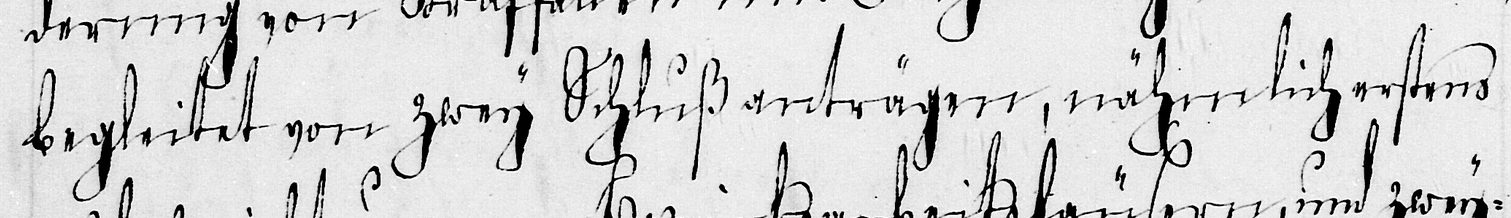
begleitet von zwey Schlußanträgen, nähmlich erstens
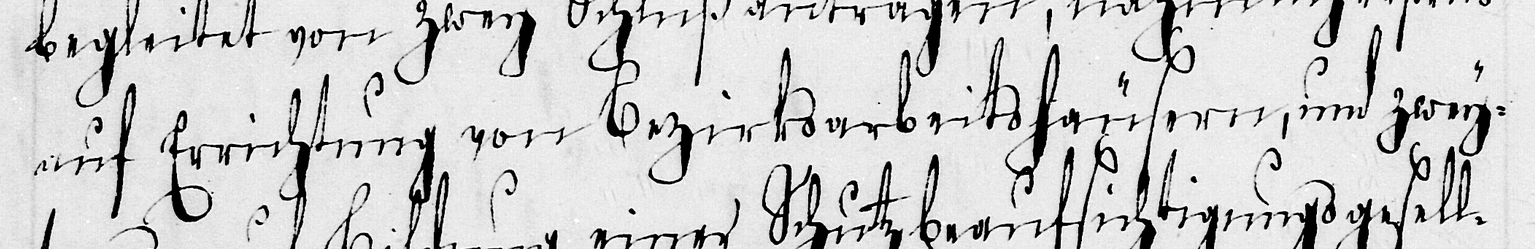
auf Errichtung von Bezirksarbeitshäusern, und zwey¬
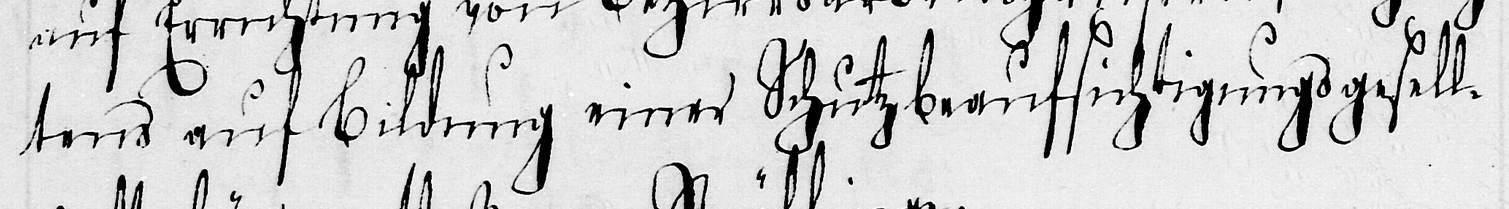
tens auf Bildung einer Schutzbeaufsichtigungsgesell¬
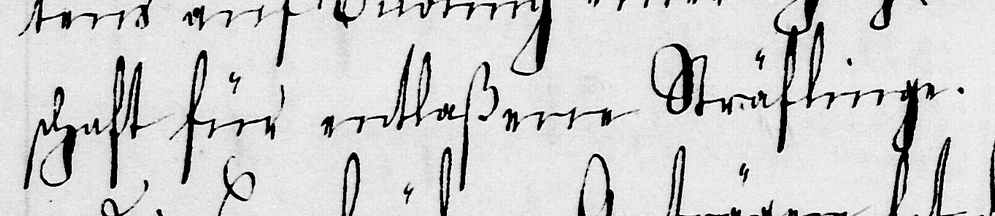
schaft für entlaßene Sträflinge.
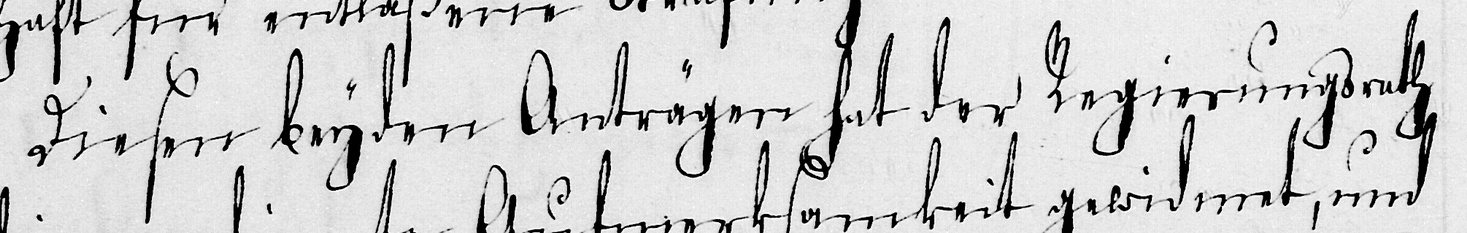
Diesen beyden Anträgen hat der Regierungsrath
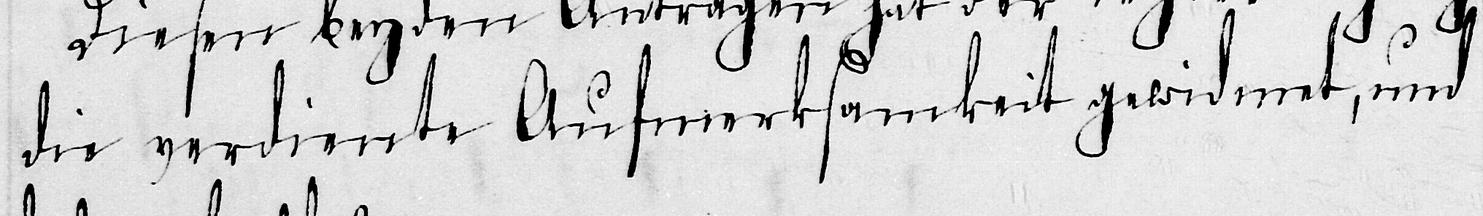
die verdiente Aufmerksamkeit gewidmet, und
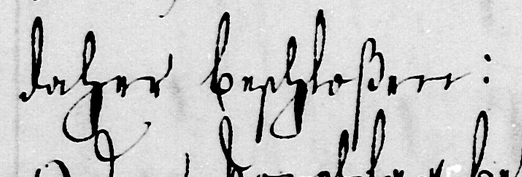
daher beschloßen:
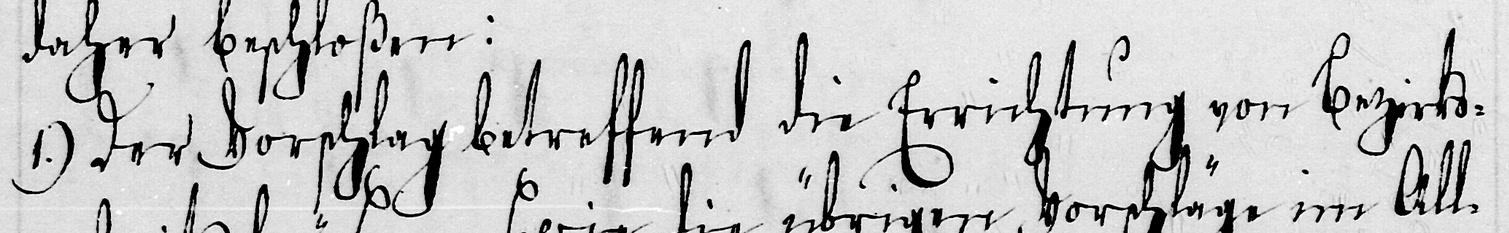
1.) Der Vorschlag betreffend die Errichtung von Bezirks¬
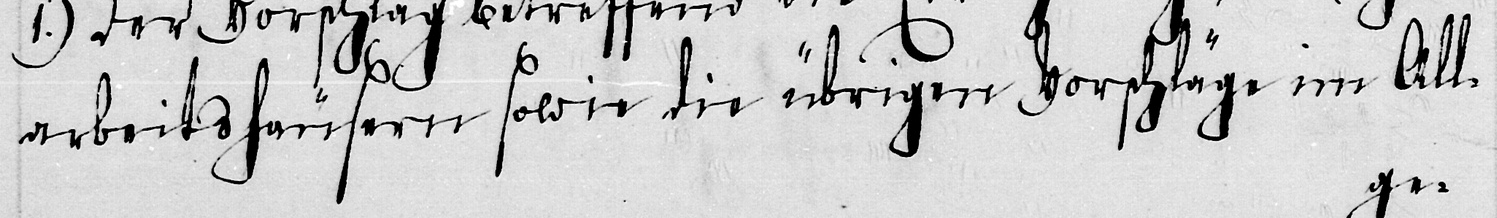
arbeitshäusern sowie die übrigen Vorschläge im All-
